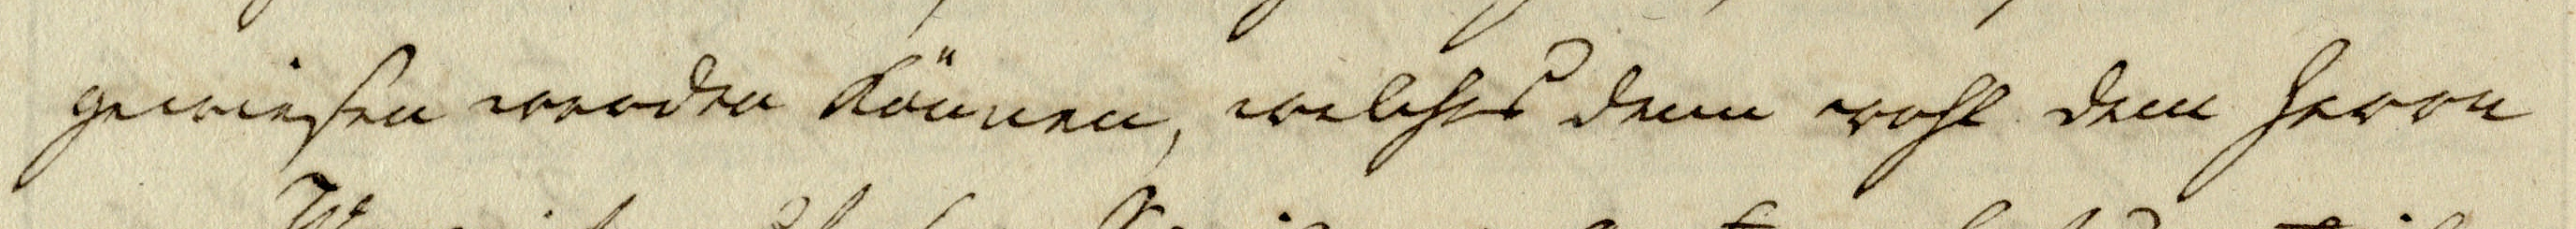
gewiesen werden können, welches den wohl dem Herrn
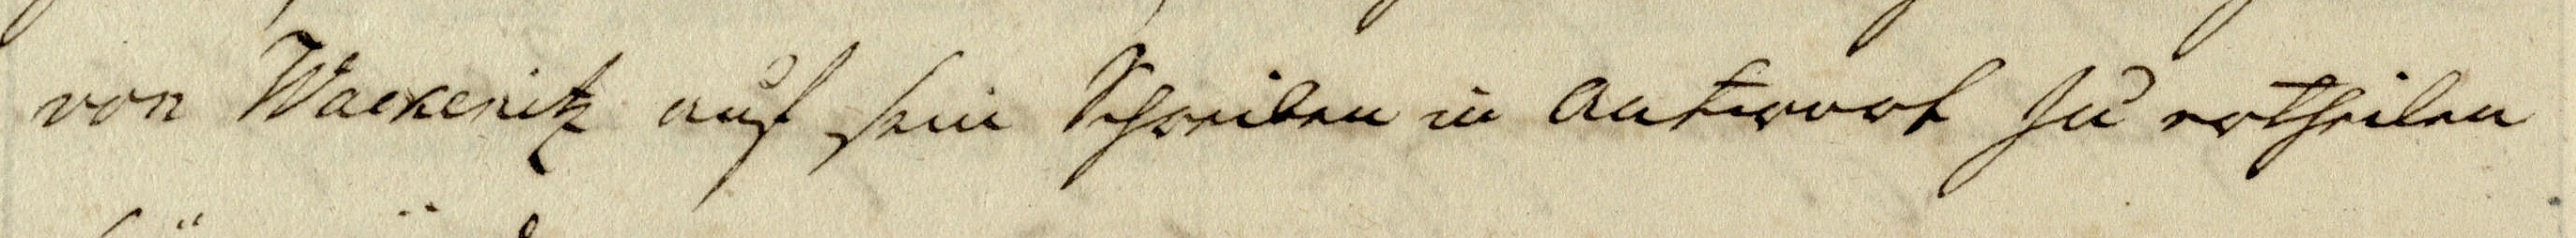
von Wackenitz auf sein Schreiben in Antwort zu ertheilen
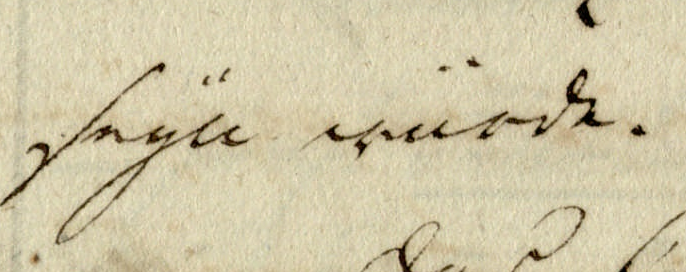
seÿn würde.
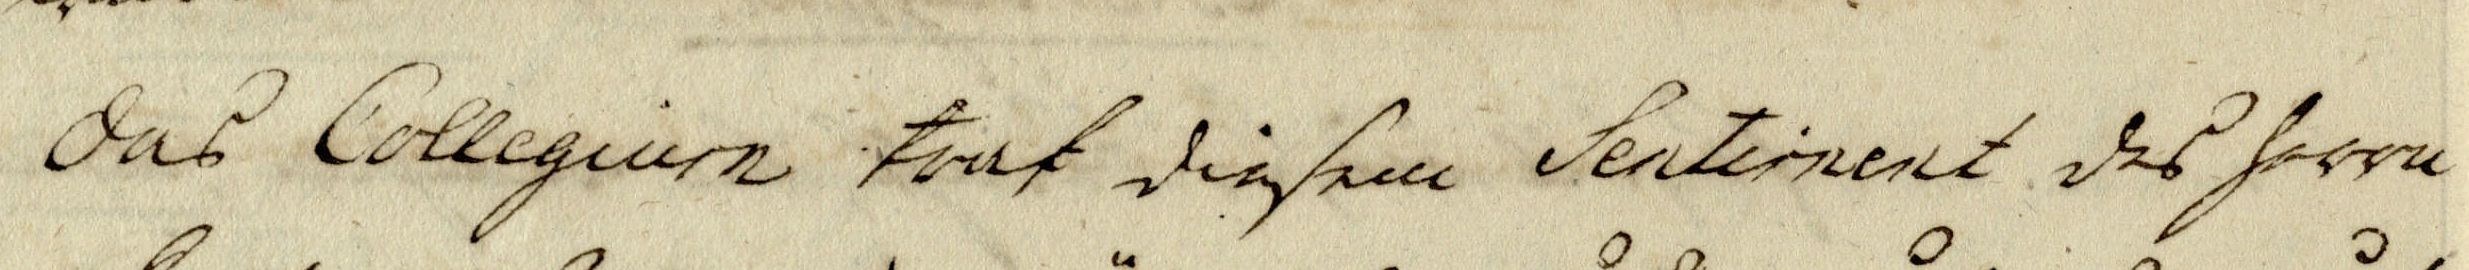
Das Collegium trat diesem Sentiment des Herrn
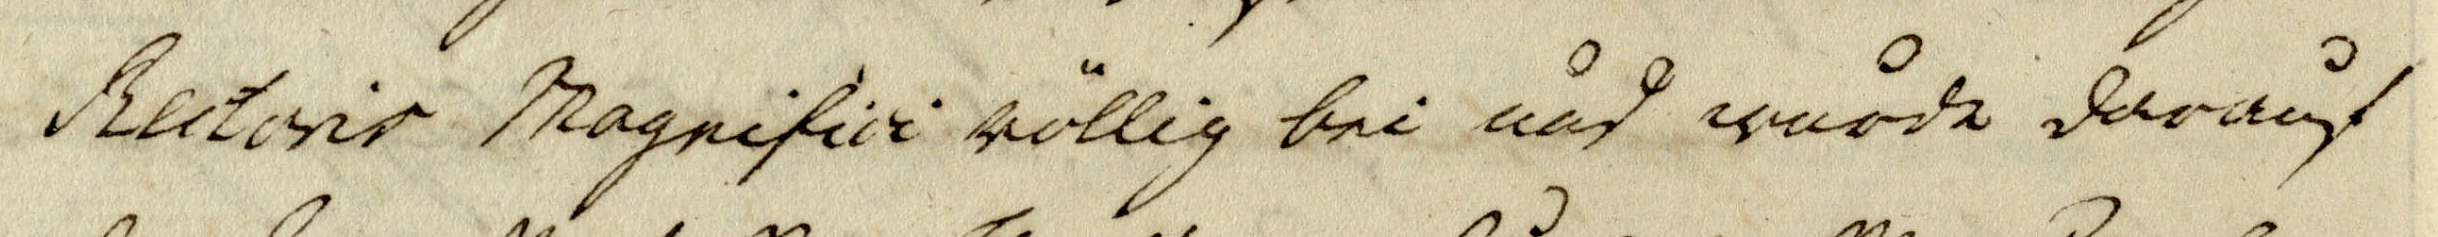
Rectoris Magnifici völlig bei und würde darauf
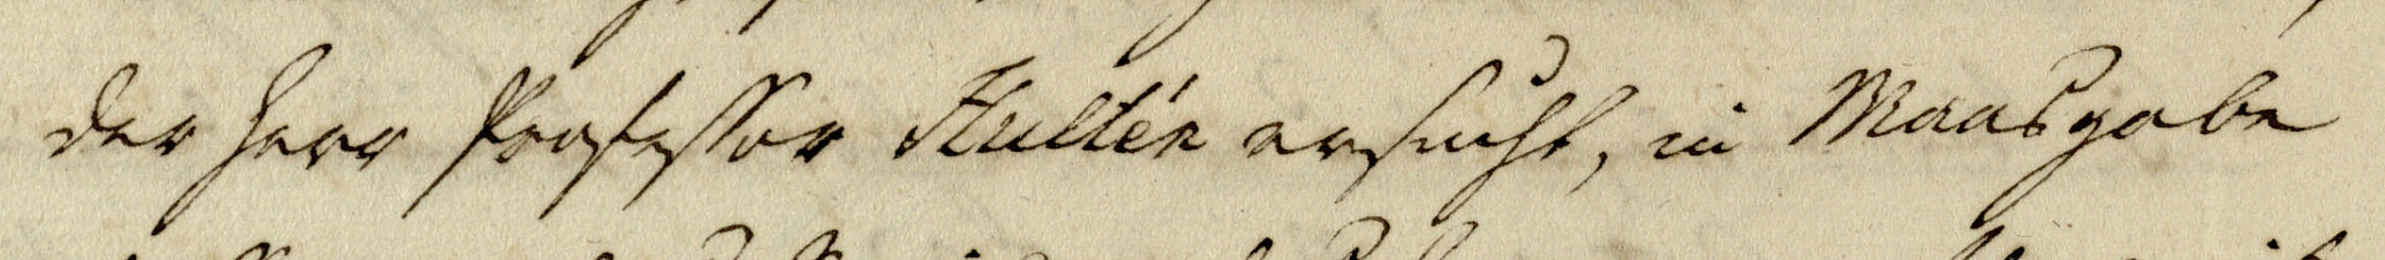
der Herr Professor Hultén ersucht, in Maasgabe
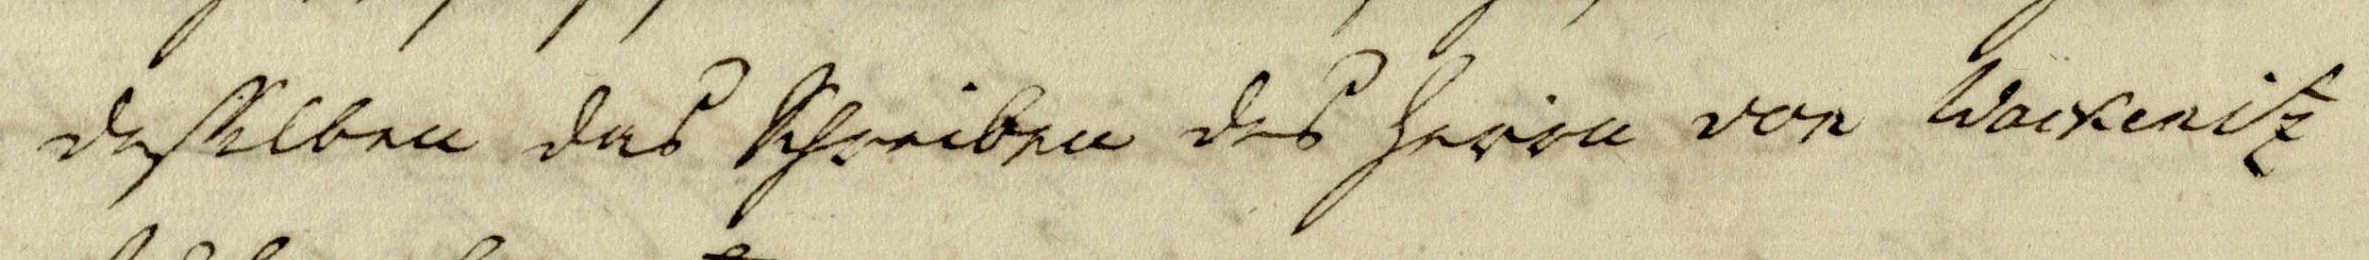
desselben das Schreiben des Herrn von Wackenitz
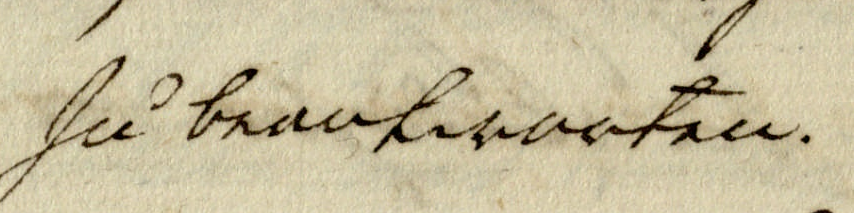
zu beantworten.
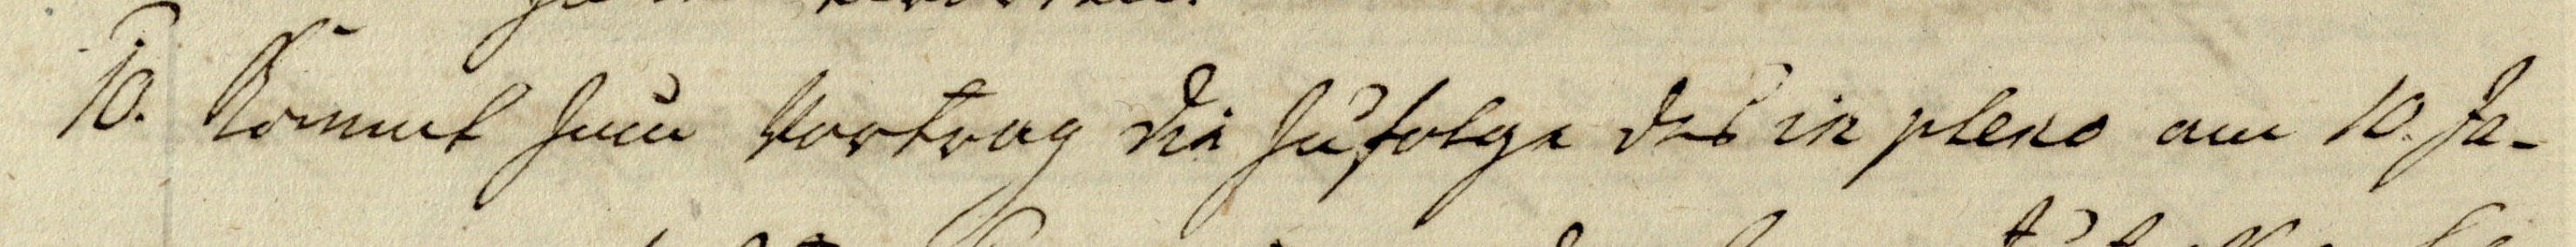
10. Kommt zum Vortrag die zufolge des in pleno am 10. Ja¬
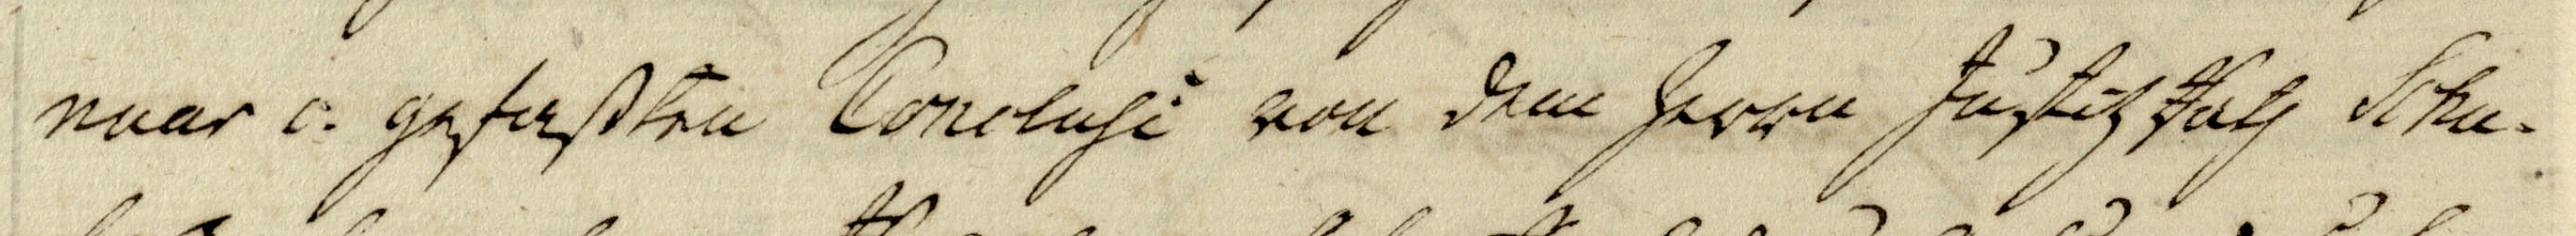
nuar c. gefaßten Conclusi von dem Herrn Justitz Rath Schu¬
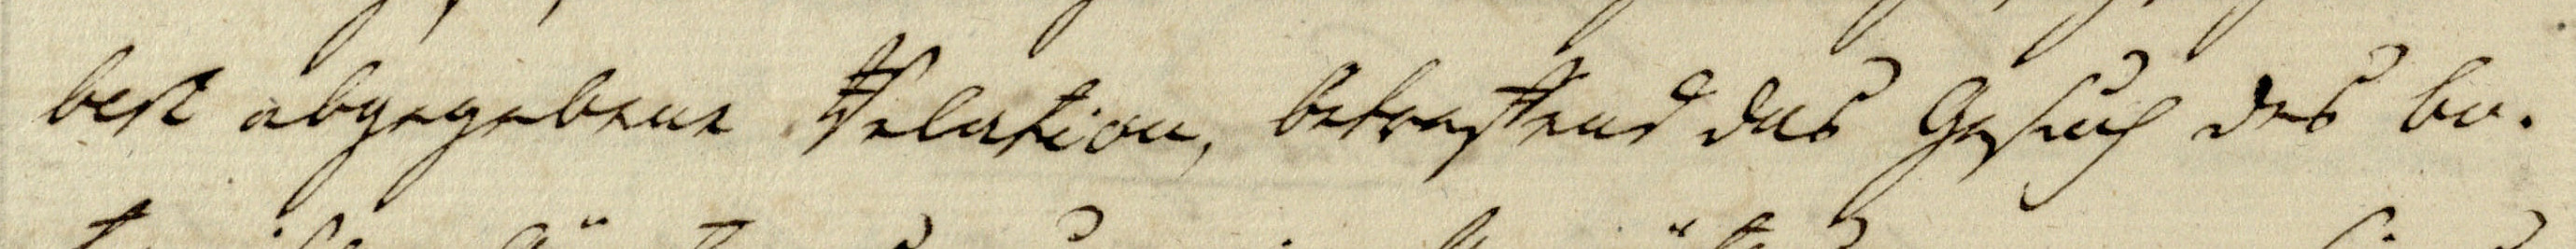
bert abgegebene Relation, betreffend das Gesuch des bo¬
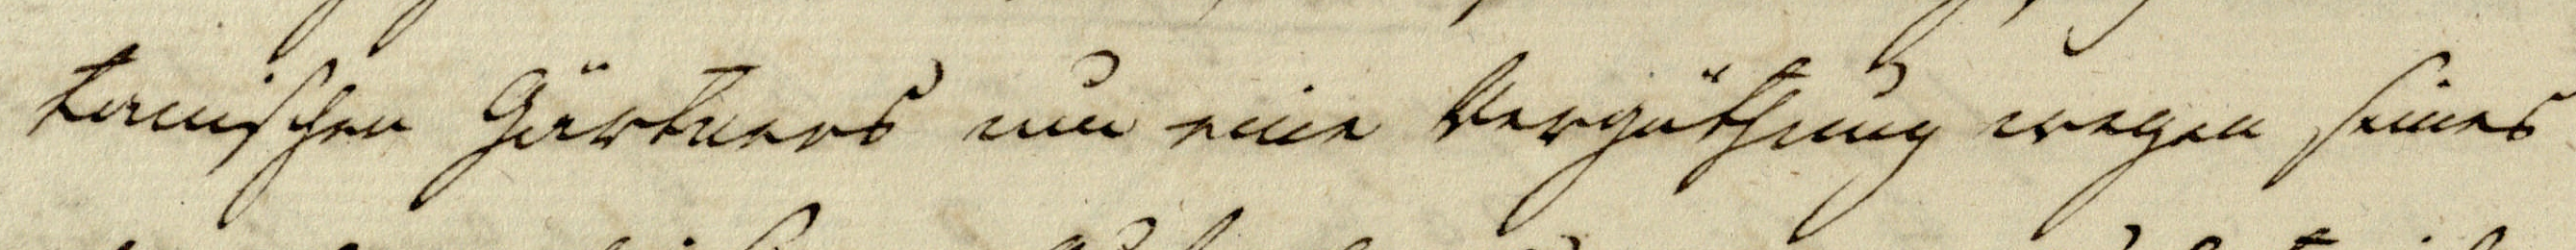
tanischen Gärtners um eine Vergüthung wegen seines
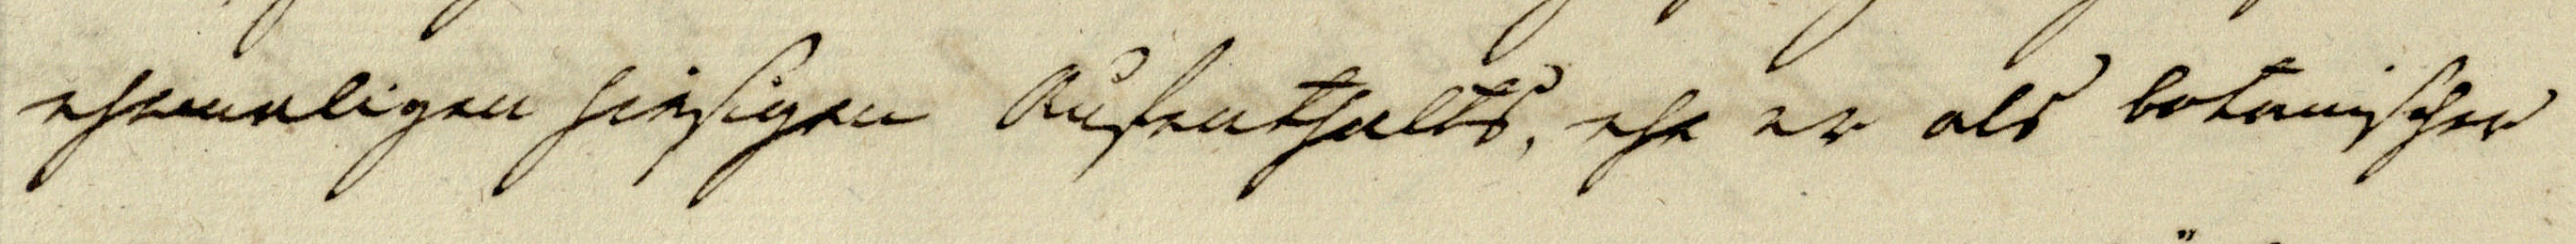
ehemaligen hiesigen Aufenthalts, ehe er als botanischer
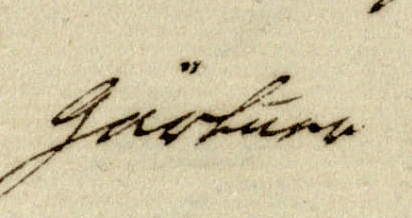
Gärtner
